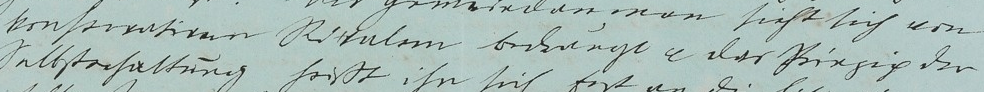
konservativen Rivalen bedrängt & das Prinzip der
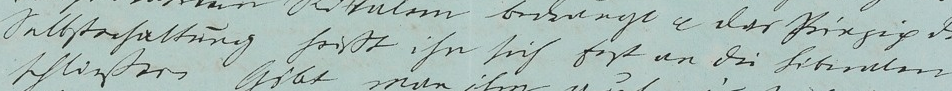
Selbsterhaltung heißt ihn sich fest an die Liberalen
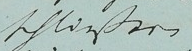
schließen.
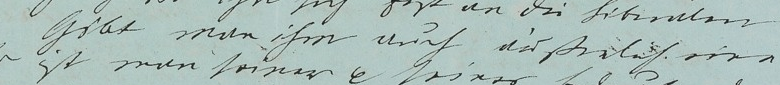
Gibt man ihm auch äußerlich eine
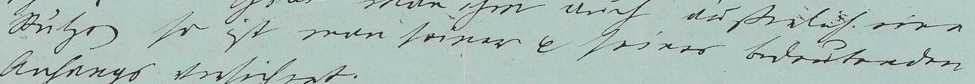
Stütze, so ist man seiner & seines bedeutenden
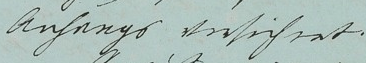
Anhangs versichert.
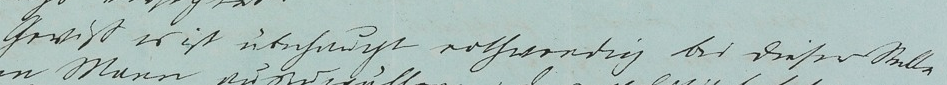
Gewiß es ist überüberhaupt nothwendig bei dieser Stelle
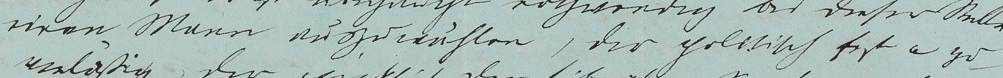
einen Mann auszuwählen, der politisch fest & zu-
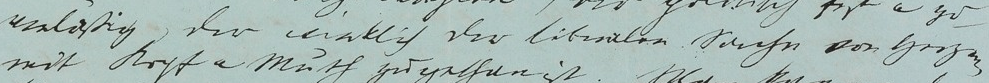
verläßig, der wirklich der liberalen Sache von Herzen,
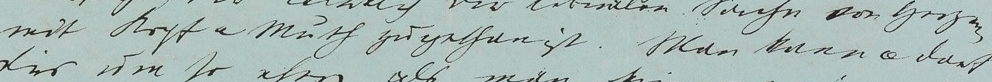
mit Kraft & Muth zugethan ist. Man kann & darf
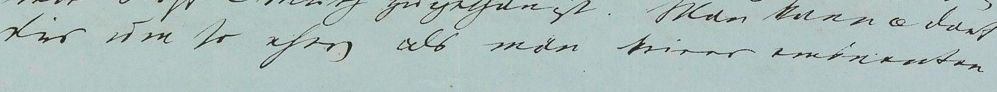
dies um so eher, als man keiner eminenten
